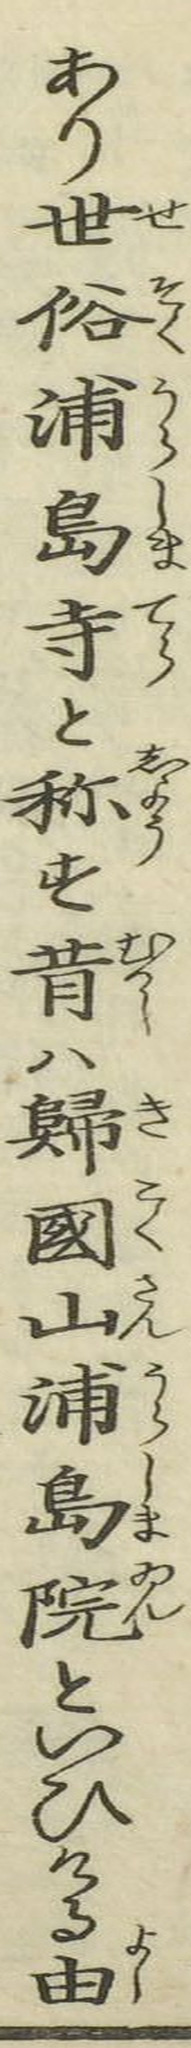あり世俗浦島寺と称す昔は歸國山浦島院といひける由
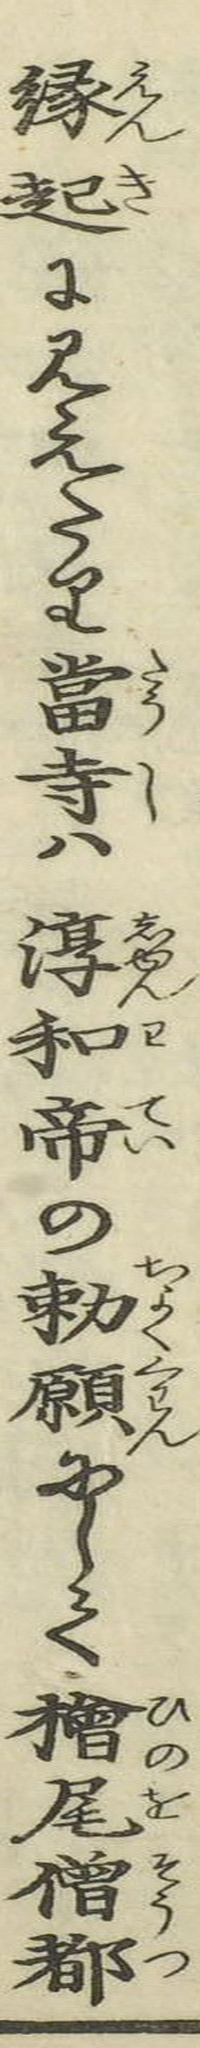縁起に見えたり當寺は淳和帝の勅願にして檜尾僧都
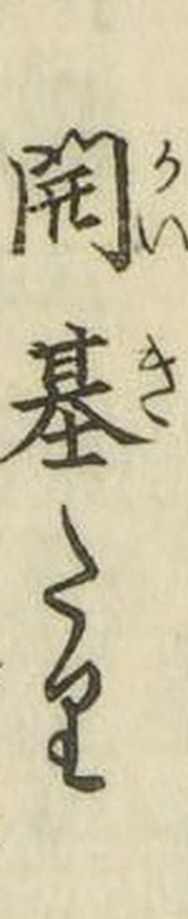開基たり
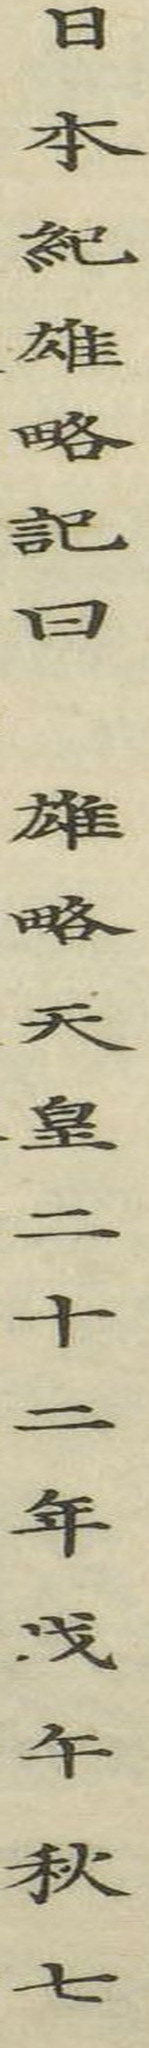日本紀雄略記曰雄略天皇二十二年戊午秋七
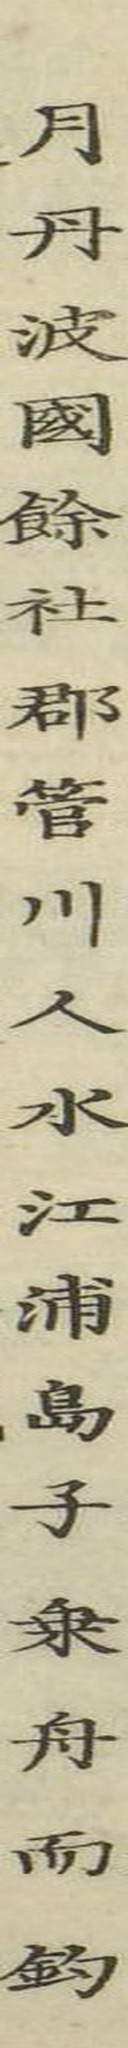月丹波國餘社郡管川人水江浦島子乗舟而釣
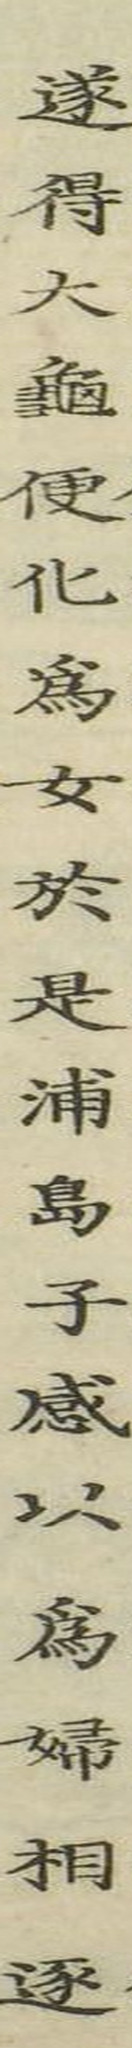遂得大亀便化為女於是浦島子感以為婦相逐
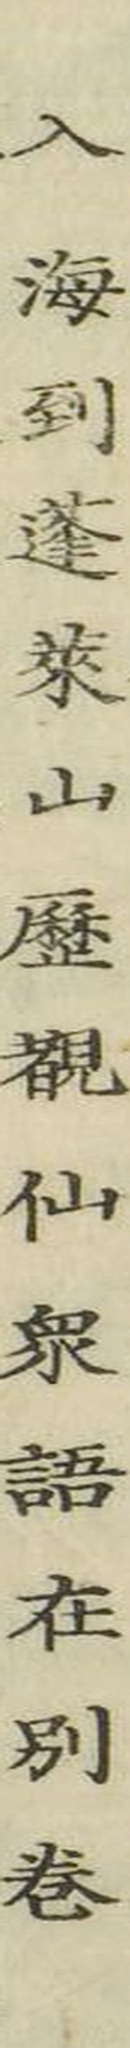入海到蓬莱山歴覩仙衆語在別巻
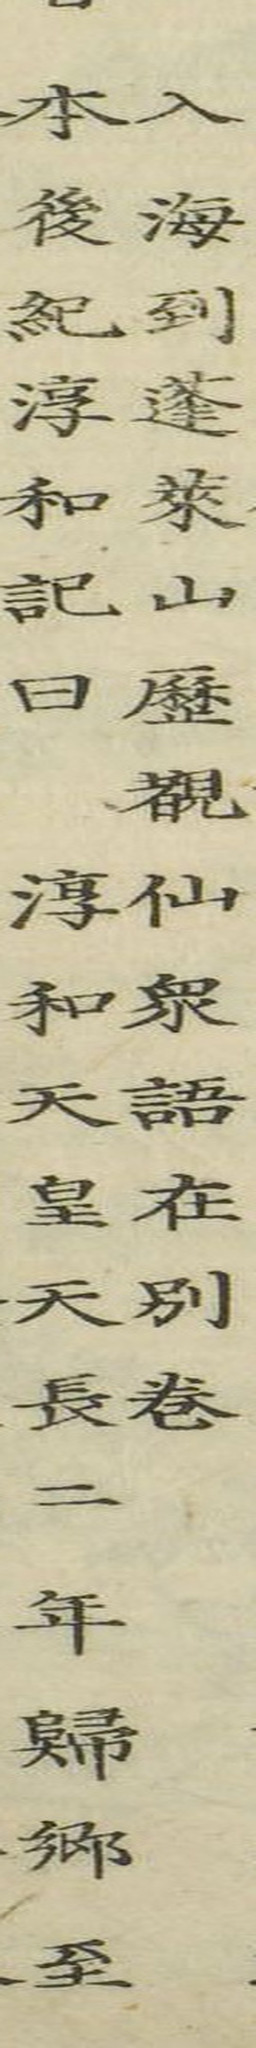日本後紀淳和記曰淳和天皇天長二年帰郷至
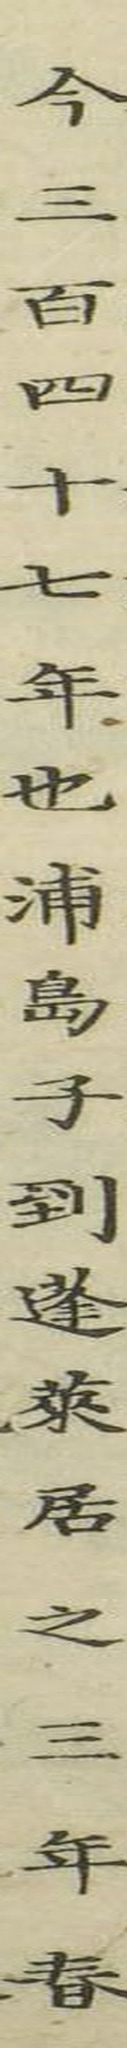今三百四十七年也浦島子到蓬莱居之三年春
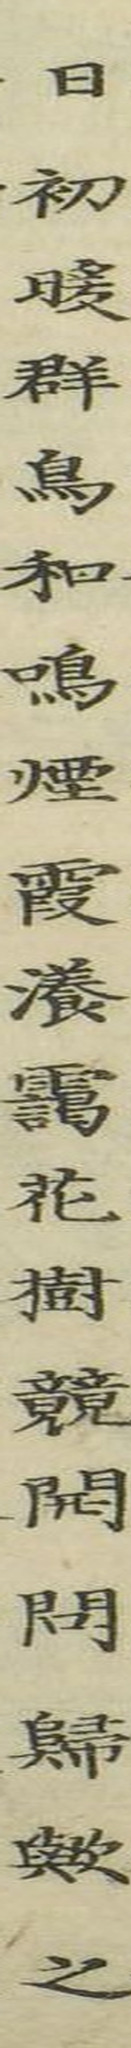日初暖群鳥和鳴煙霞瀁靄花樹競開問歸歟之
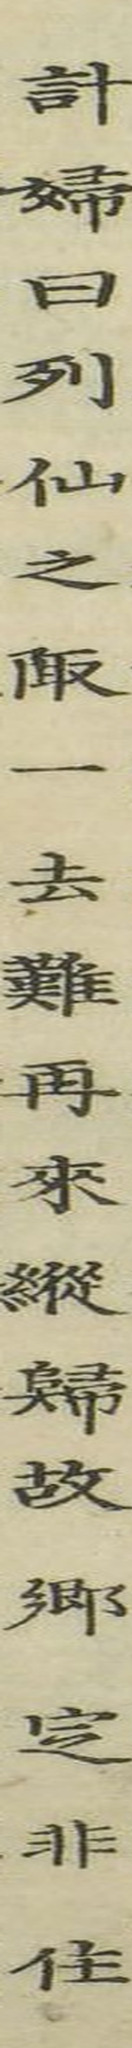計婦曰列仙之陬一去難再来縦歸故郷定非住
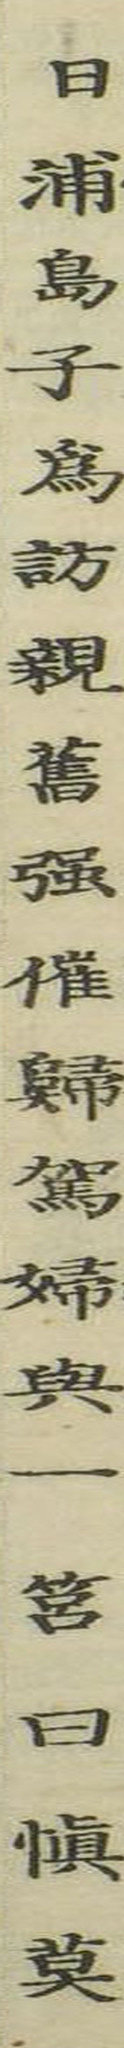日浦島子為訪親舊強催歸駕婦與一筥曰慎莫

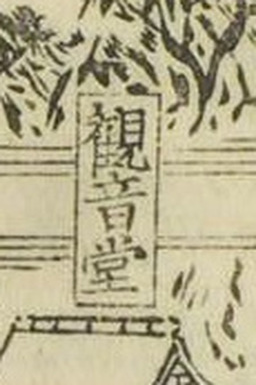観音堂
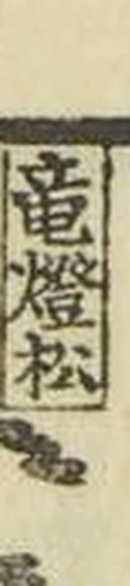竜燈松
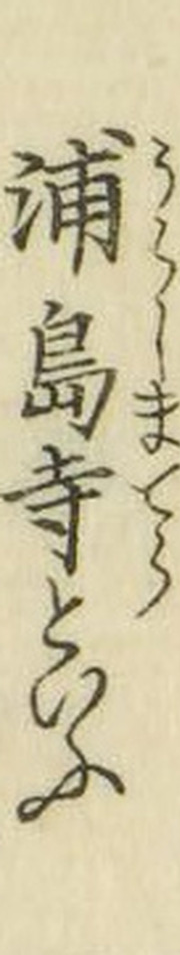浦島寺といふ

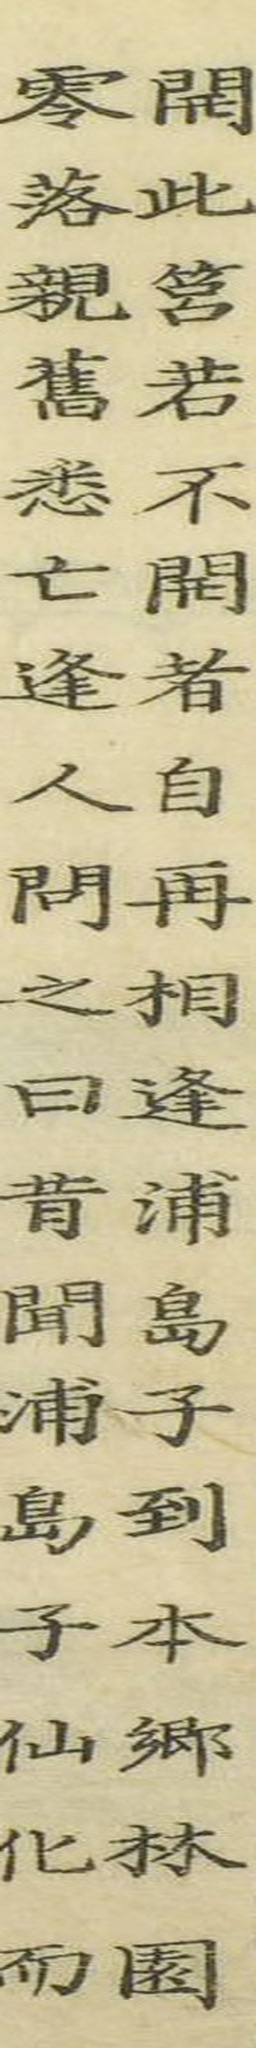零落親舊悉亡逢人問之曰昔聞浦島子仙化而
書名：江戸名所図会 20巻 巻之5
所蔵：東京学芸大学教育コンテンツアーカイブ
